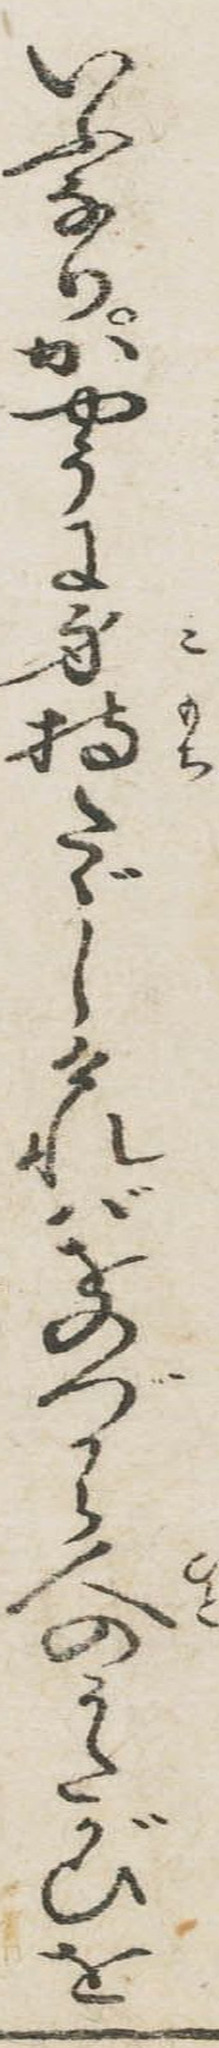いふなり。かやうに身持たゞしければをのづから人のうたがひを
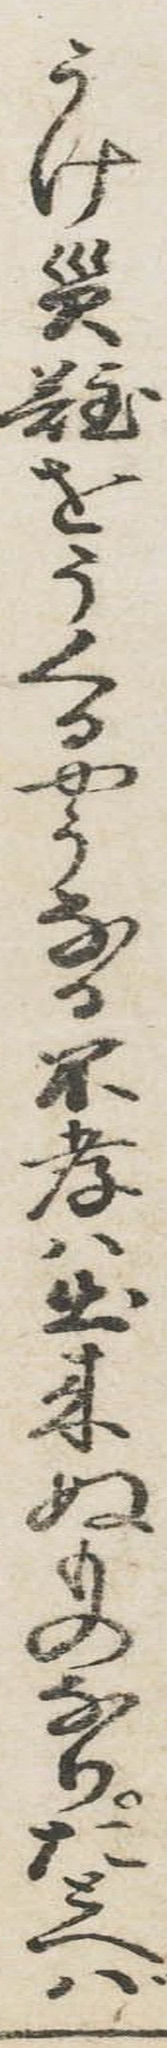うけ災難をうくるやうなる不孝は出来ぬものなり。たとへば
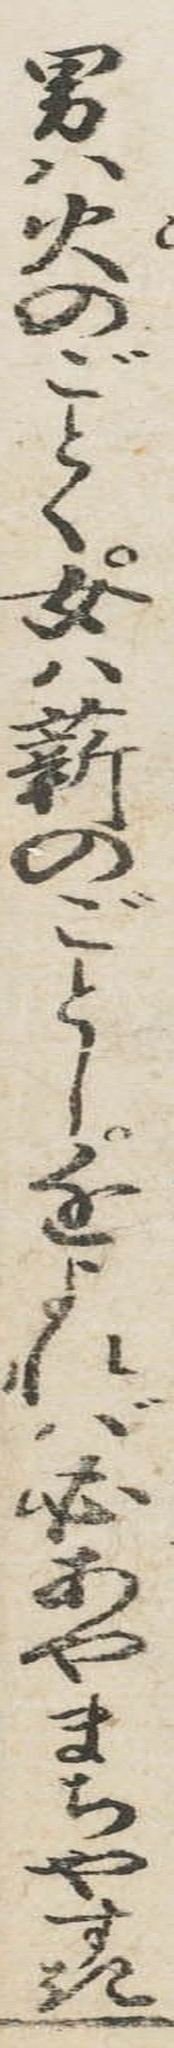男は火のごとく。女は薪のごとし。近よれば必あやまちやすき
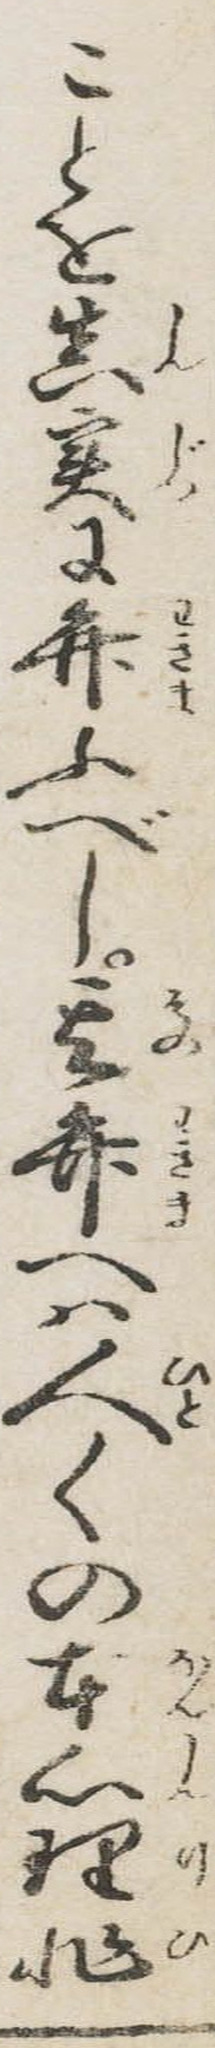ことを真実に弁ふべし。其弁へは人〳〵の本心理非
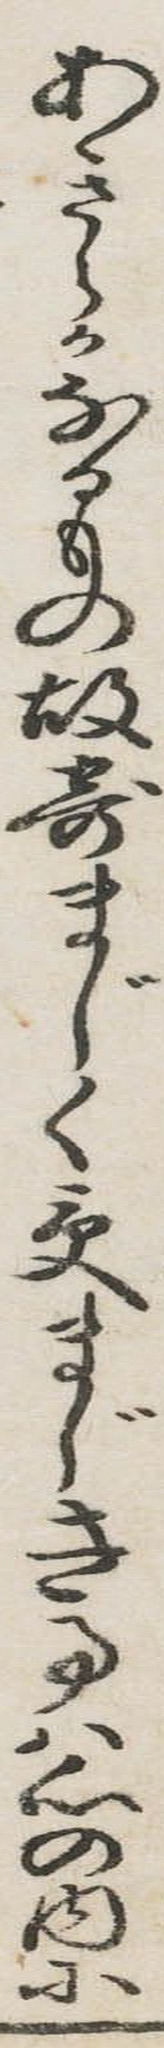あきらかなるもの故寄まじく受まじき事は心の内に
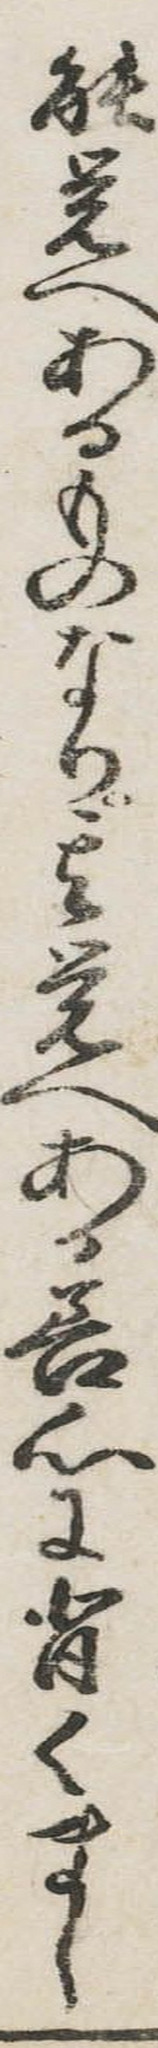能覚へあるものなり。其覚へある善心に背くまし
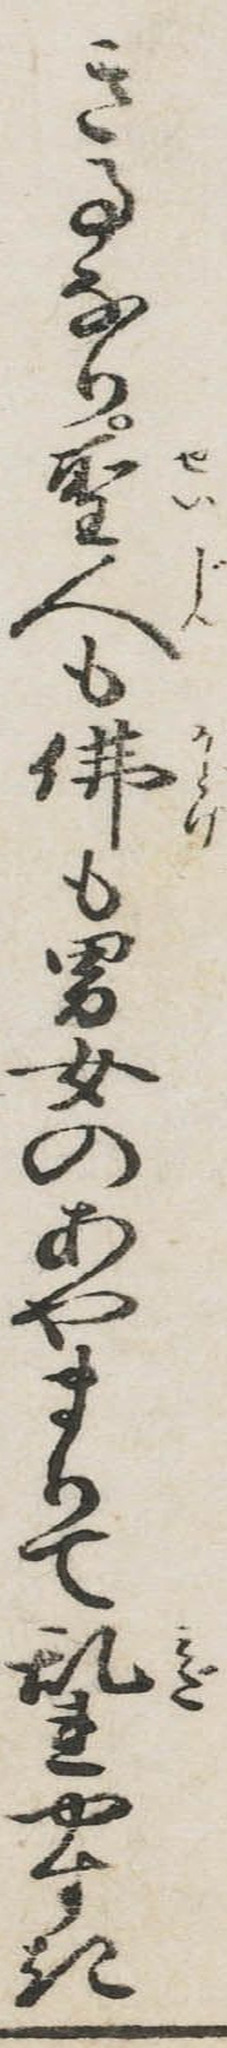き事なり。聖人も仏も男女のあやまりて乱れやすき
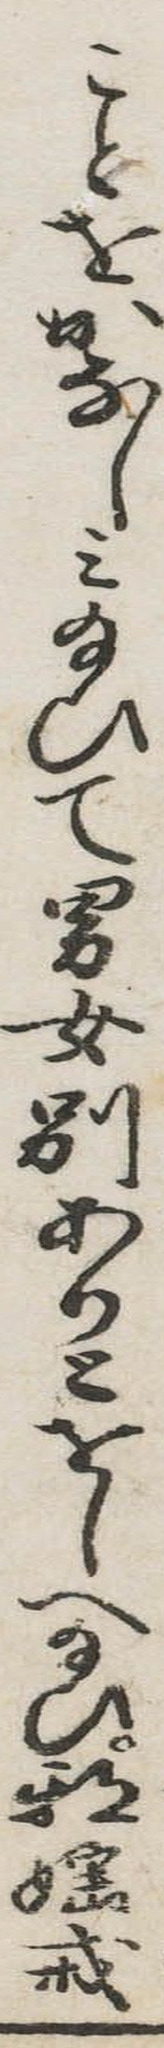ことをかなしみ給ひて男女別ありとをしへ給ひ。邪淫戒
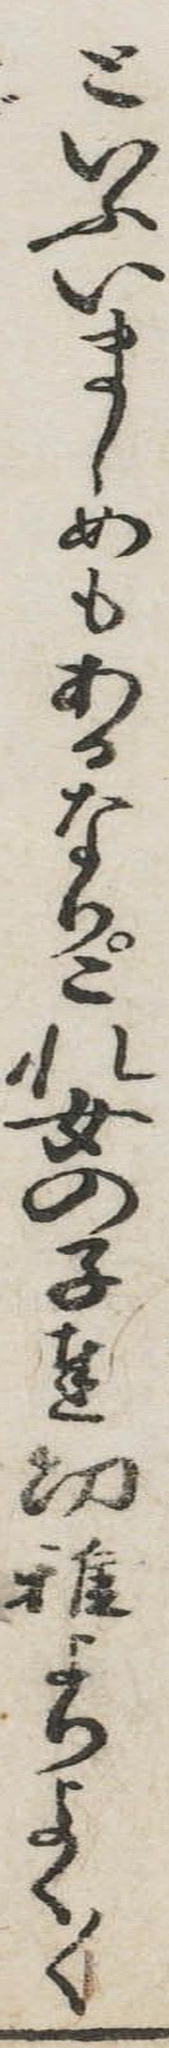といふいましめもあるなり。これ女の子達幼稚よりよく〳〵
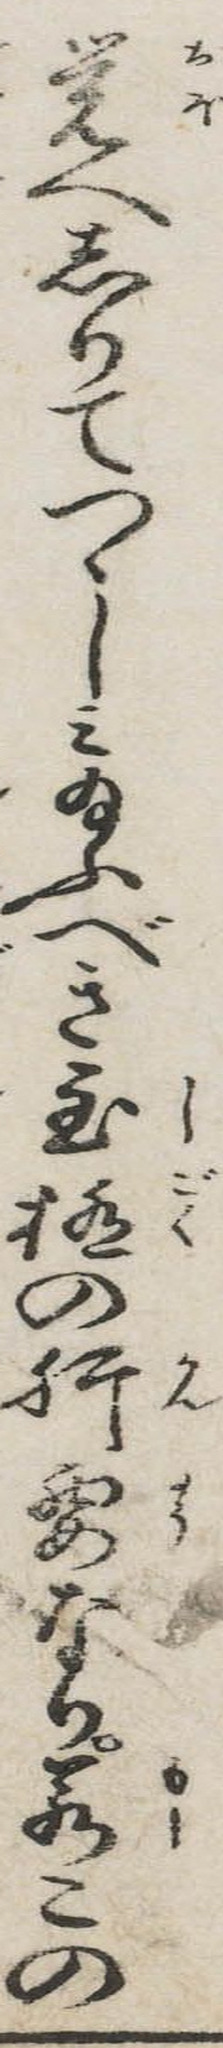覚へしりてつゝしみ給ふべき至極の肝要なり。若この
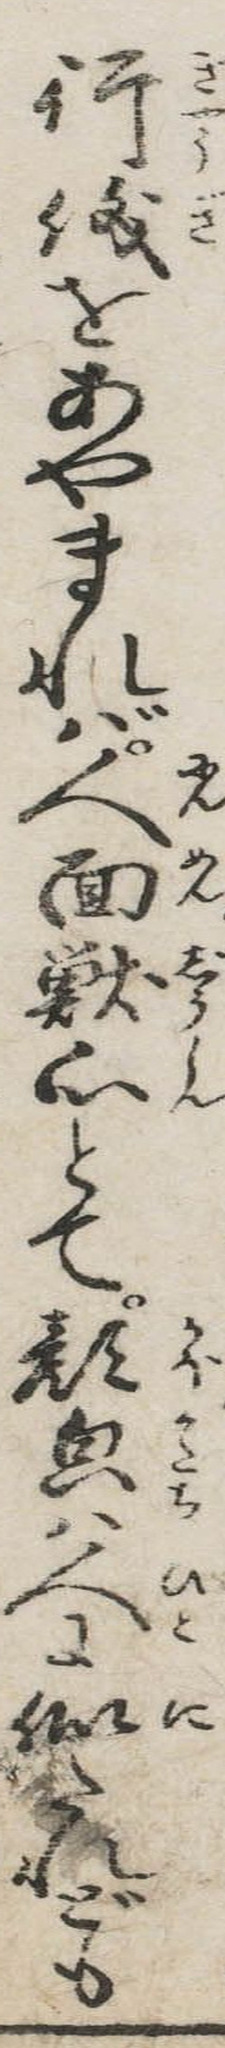行儀をあやまれば。人面獣心とて。顔皃は人に似たれども
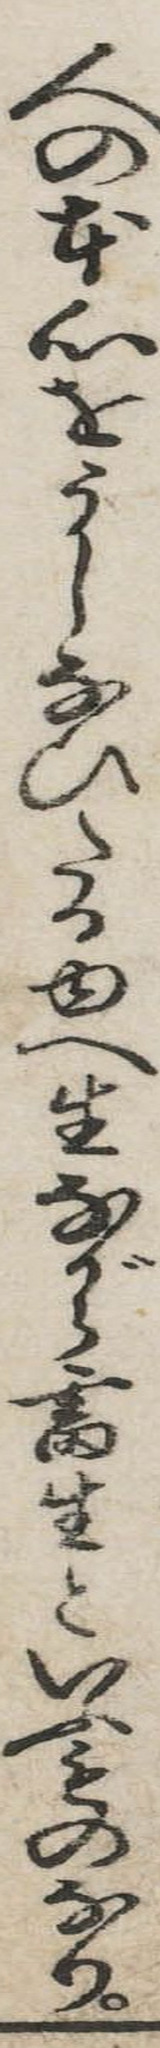人の本心をうしなひたるゆへ生ながら畜生といふものなり。
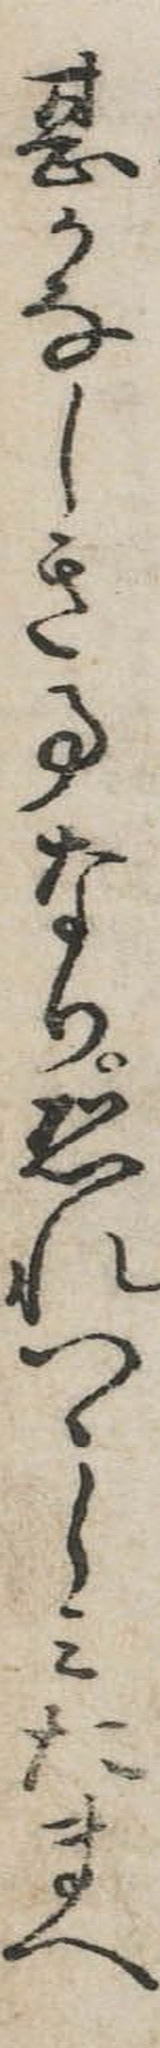甚かなしき事なり。恐れつゝしみたまへ

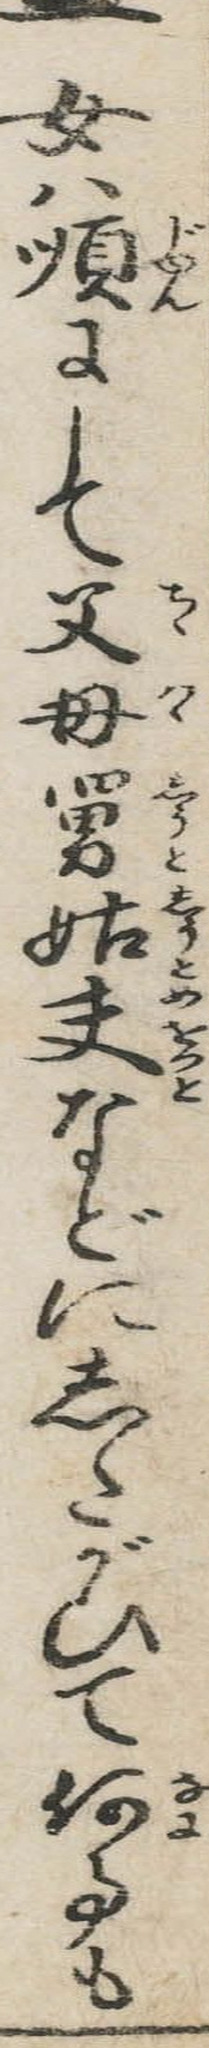一女は順にして父母舅姑夫などにしたがひて何事も
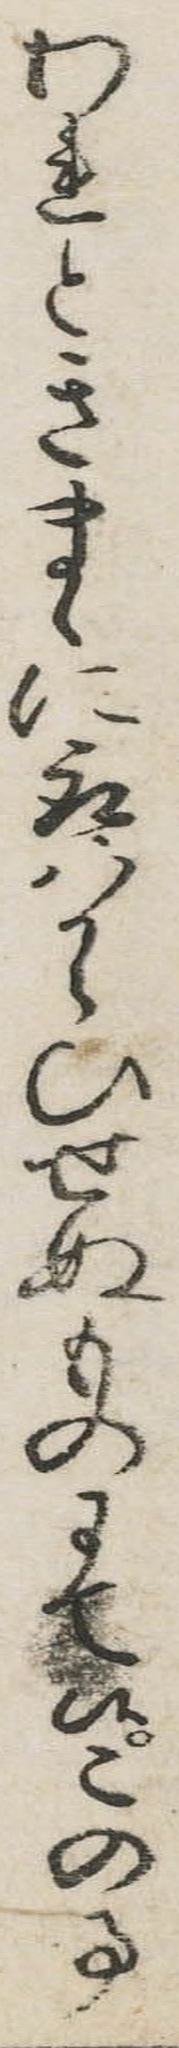われときまゝに取はからひせぬものにて候。この事
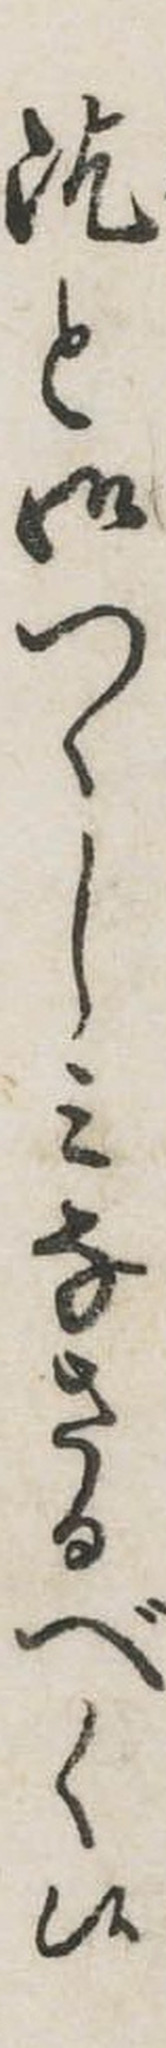屹と御つゝしみなさるべく候
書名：前訓
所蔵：東京学芸大学附属図書館
